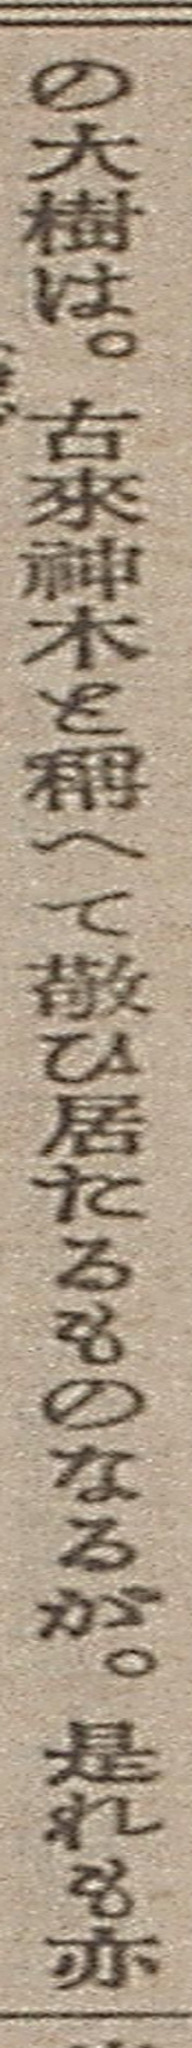の大樹は。古来神木と称へて敬ひ居たるものなるが。是れも亦
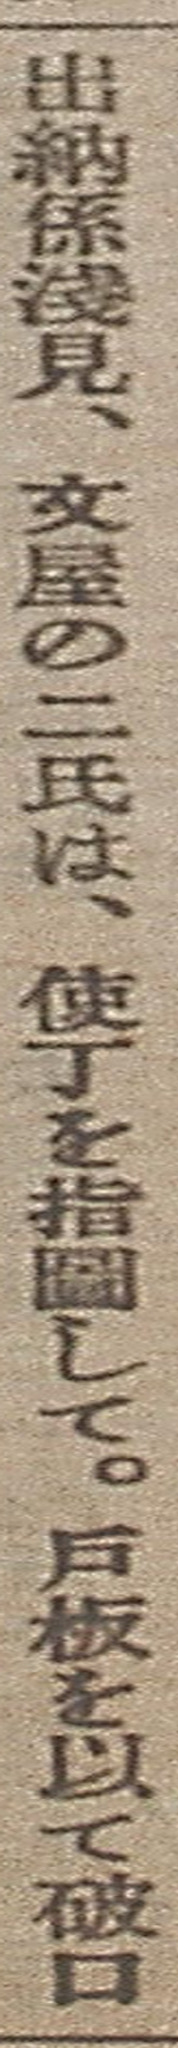出納係浅見、文屋の二氏は、使丁を指図して。戸板を以て破口
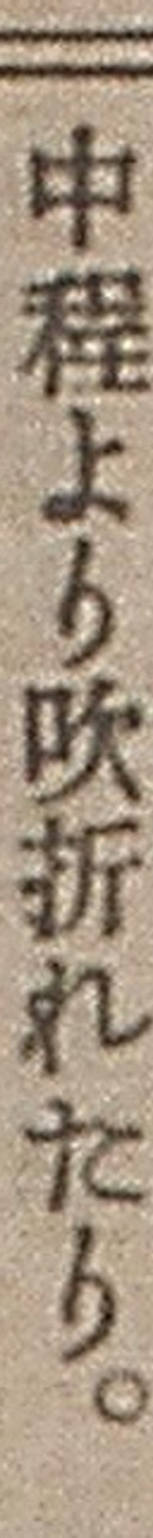中程より吹折れたり。
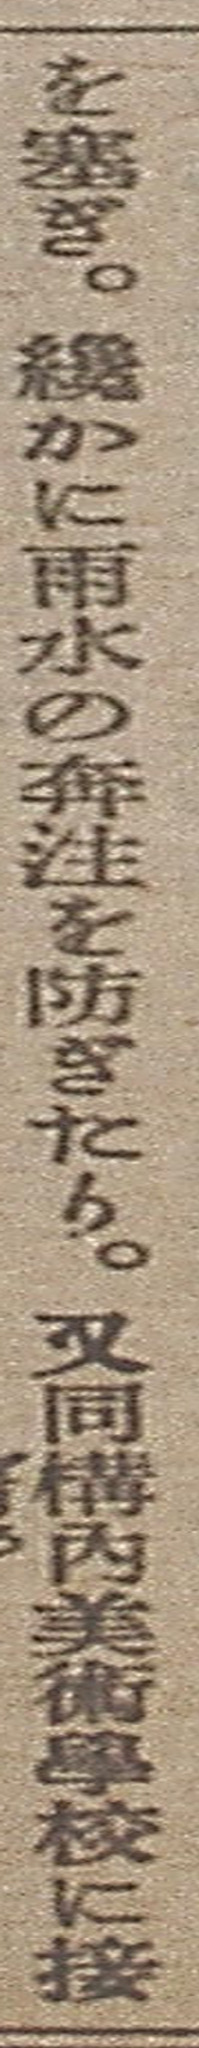を塞ぎ。纔かに雨水の奔注を防ぎたり。又同構内美術学校に接
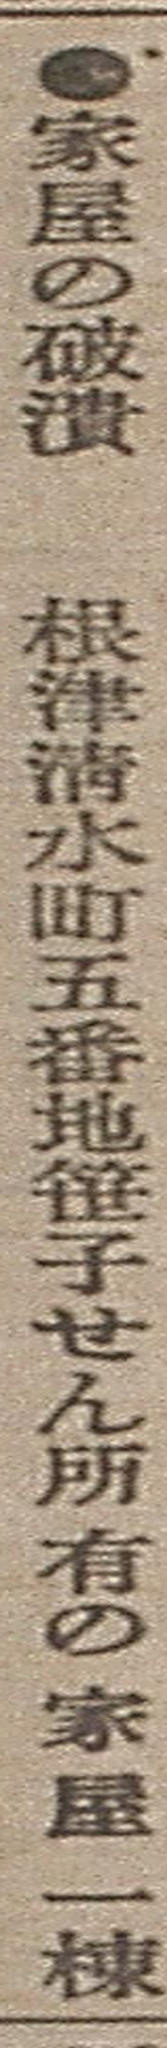●家屋の破潰根津清水町五番地笹子せん所有の家屋一棟
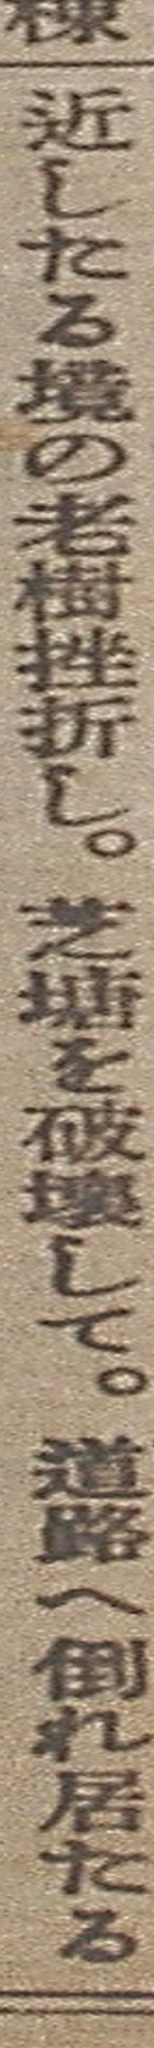近したる境の老樹挫折し。芝塘を破壊して。道路へ倒れ居たる
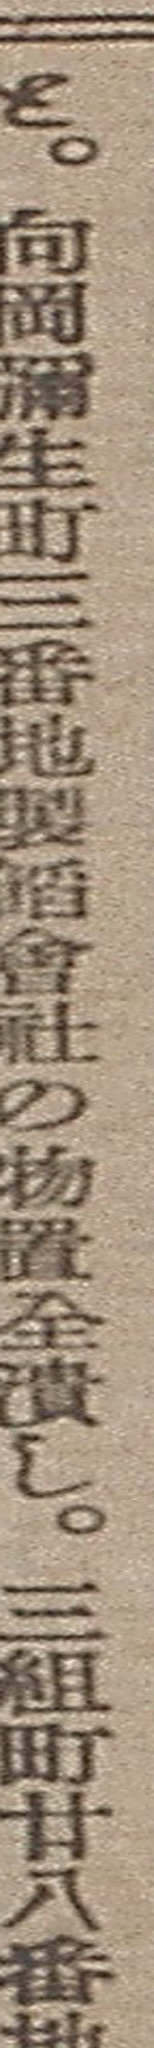と。向岡彌生町三番地製餡会社の物置全潰し。三組町廿八番地
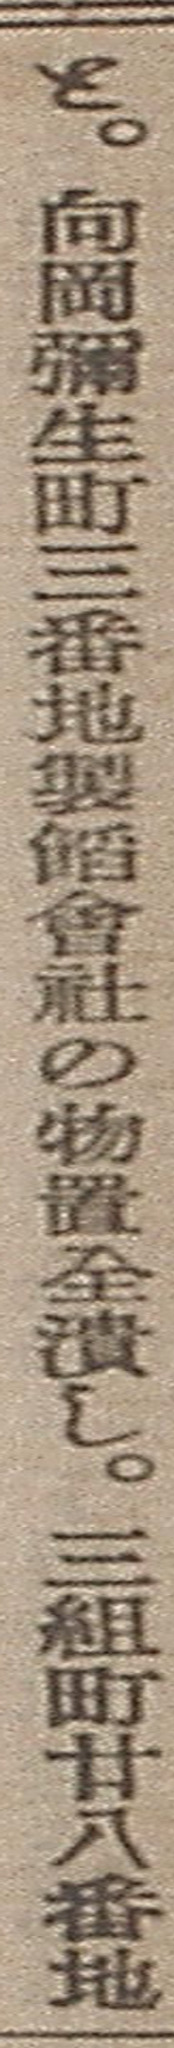と。向岡彌生町三番地製餡会社の物置全潰し。三組町廿八番地
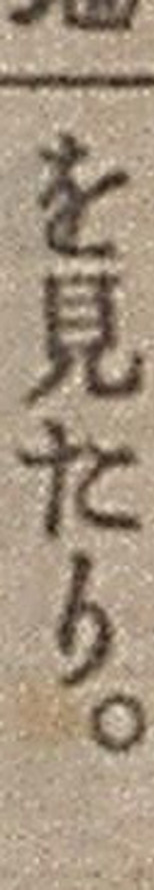を見たり。
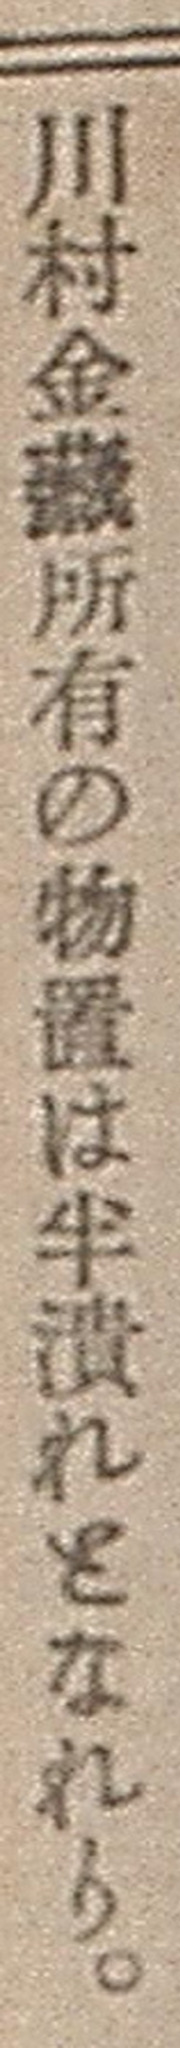川村金蔵所有の物置は半潰れとなれり。
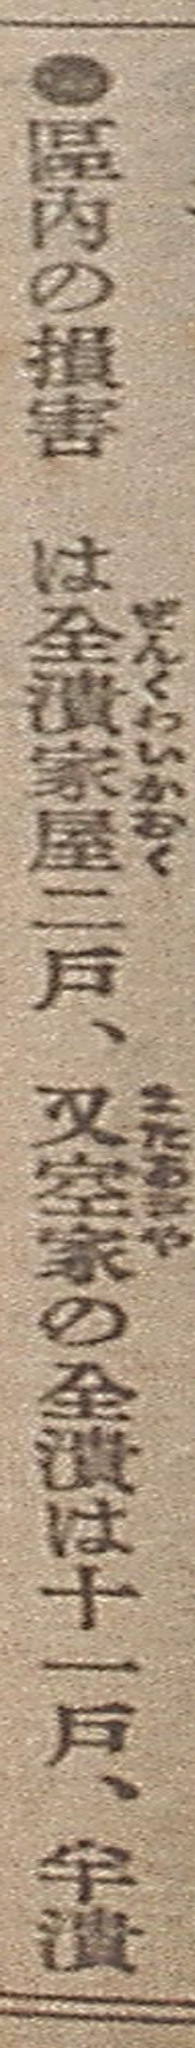●区内の損害は全潰家屋二戸、又空家の全潰は十一戸、半潰
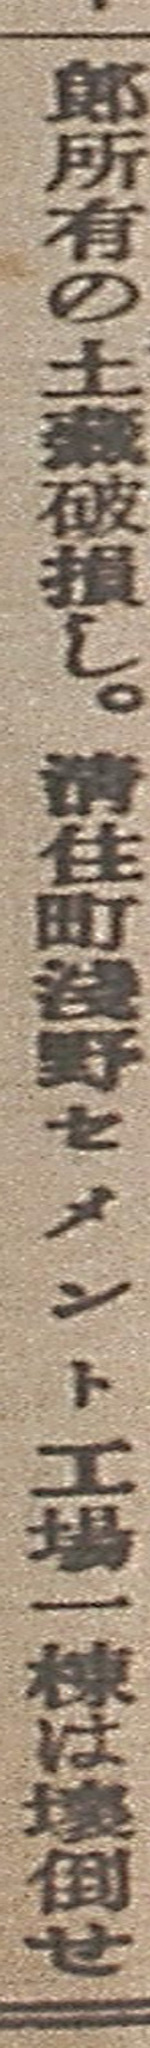郎所有の土蔵破損し。清住町浅野セメント工場一棟は壊倒せ
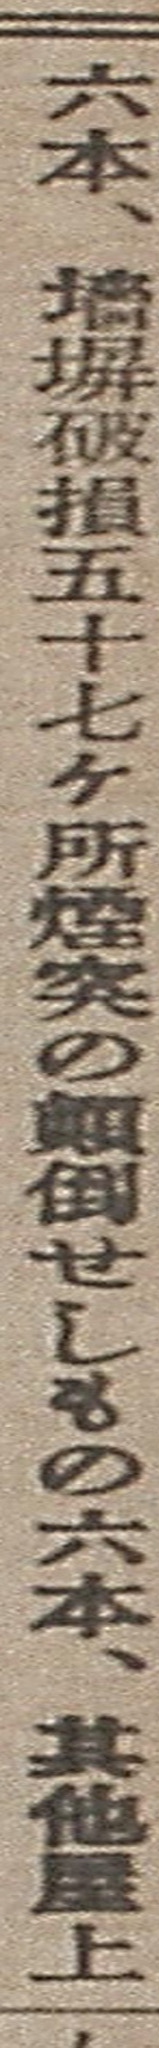六本、墻塀破損五十七ケ所煙突の顛倒せしもの六本、其他屋上
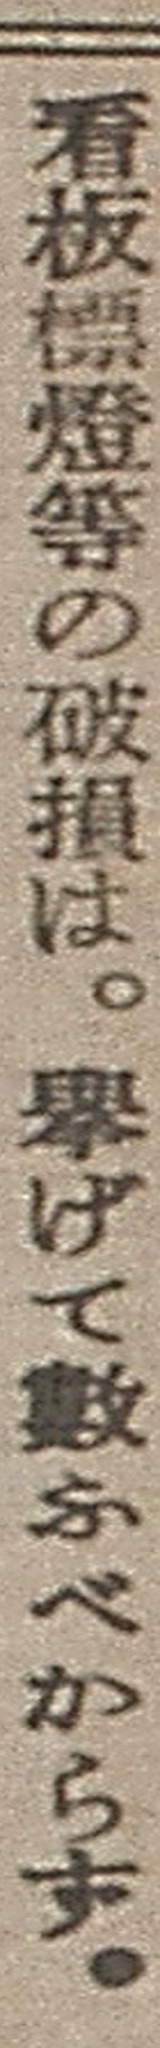看板標燈等の破損は。挙げて数ふべからず。
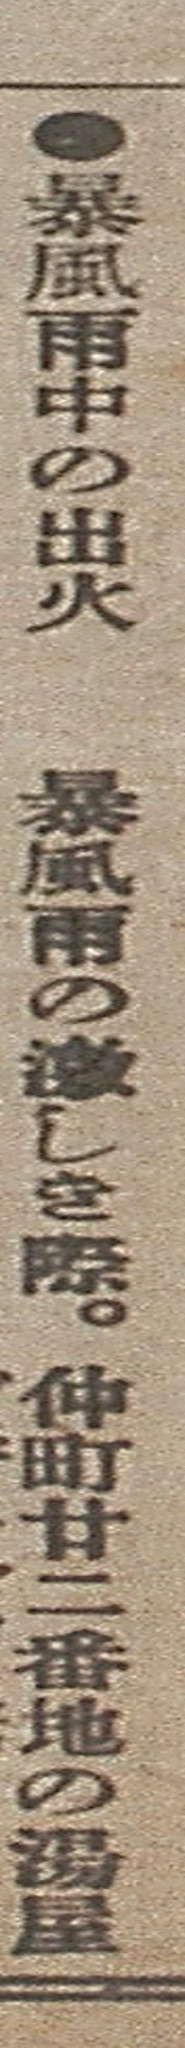●暴風雨中の出火暴風雨の激しき際。仲町廿ニ番地の湯屋
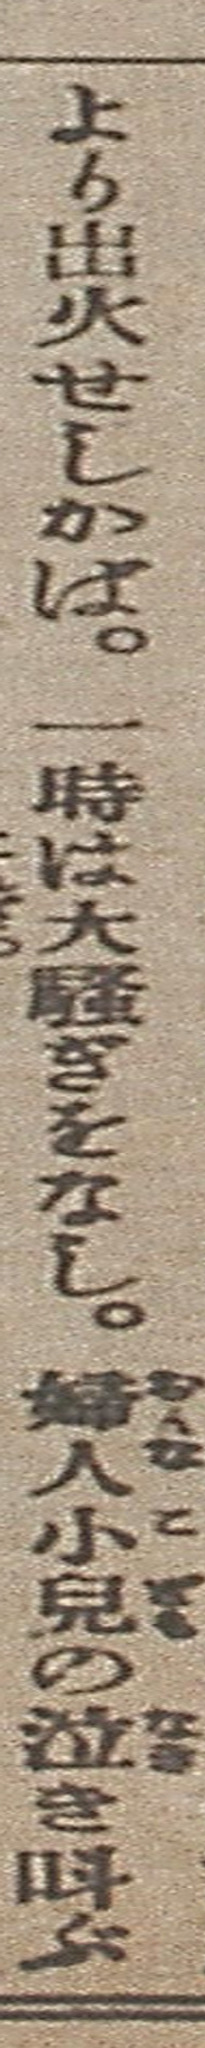より出火せしかば。一時は大騒ぎをなし。婦人小児の泣き叫ぶ
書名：風俗畫報臨時増刊第百九十九號　明治三十二年十月各地災害圖會（前編之續）
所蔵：東京大学地震研究所図書室 Earthquake Research Institute Library, The University of Tokyo, JAPAN
